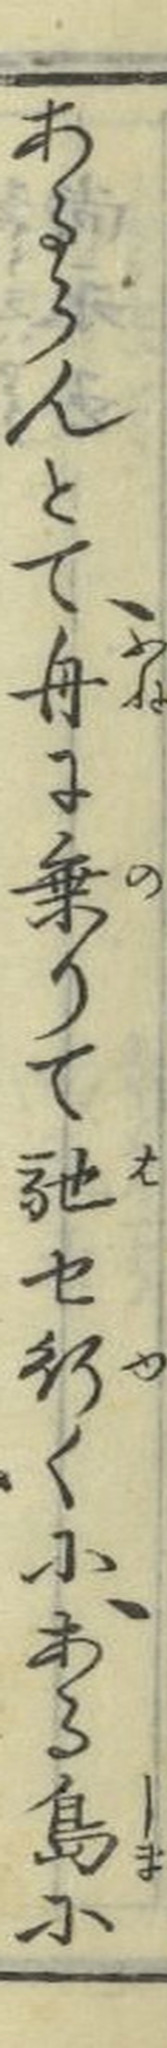あるらんとて、舟に乗りて馳せ行くに、ある島に
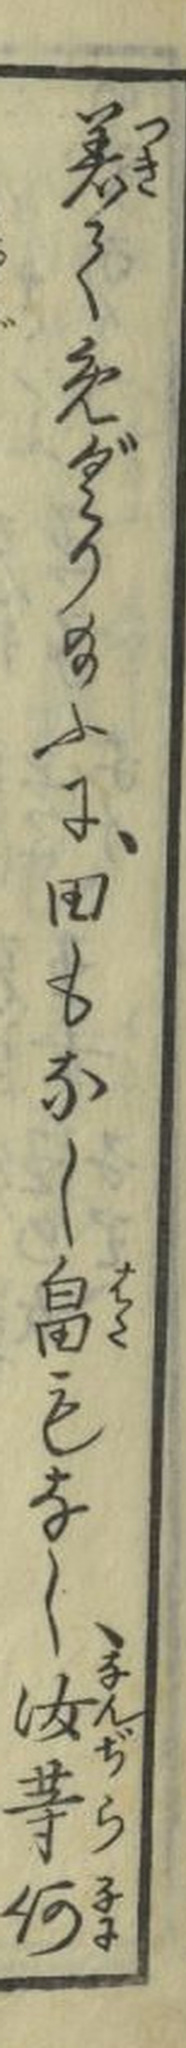着てめぐり給ふに、田もなし畠もなし、汝等何
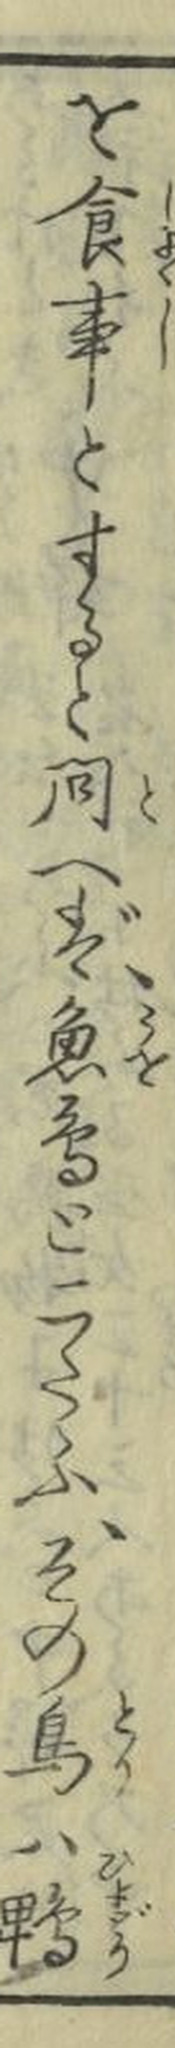を食事とすると問へば、魚鳥とこたふ、その鳥は鵯
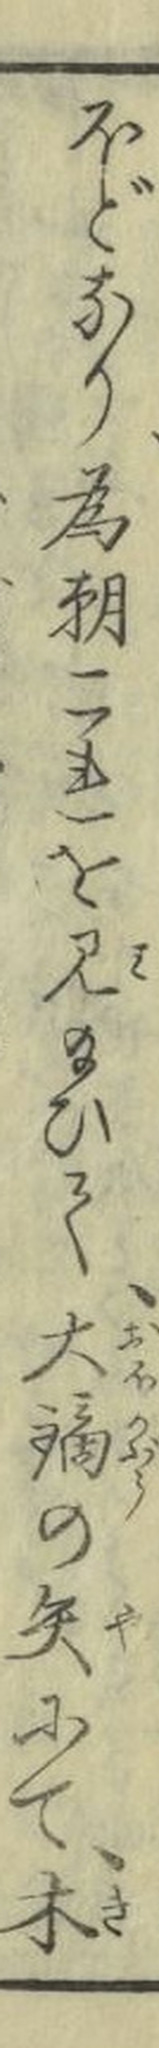ほどなり、為朝これを見給ひて、大鏑の矢にて、木
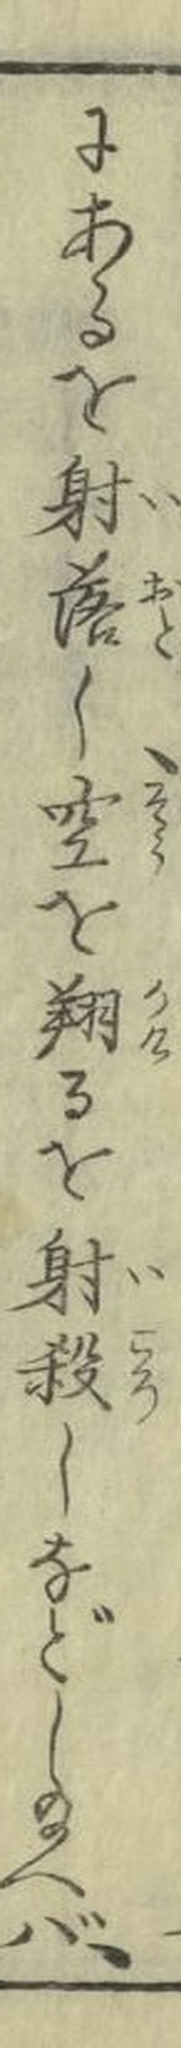にあるを射落し、空を翔るを射殺しなどし給へば、
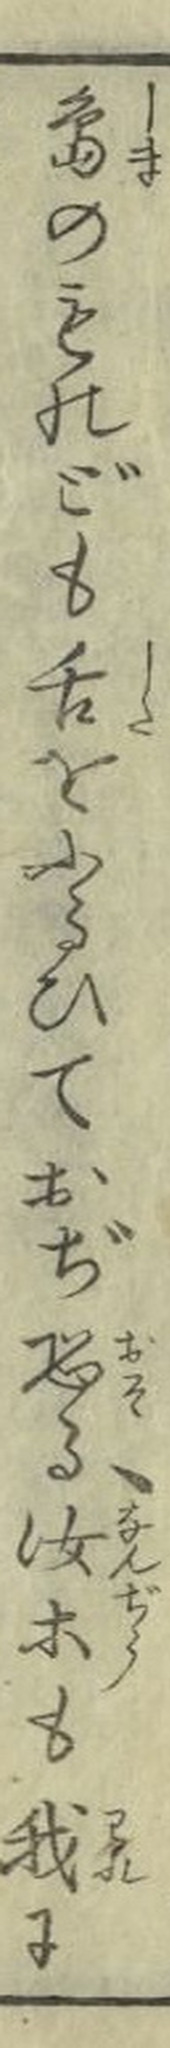島のものども舌をふるひておぢ恐る、汝等も我に
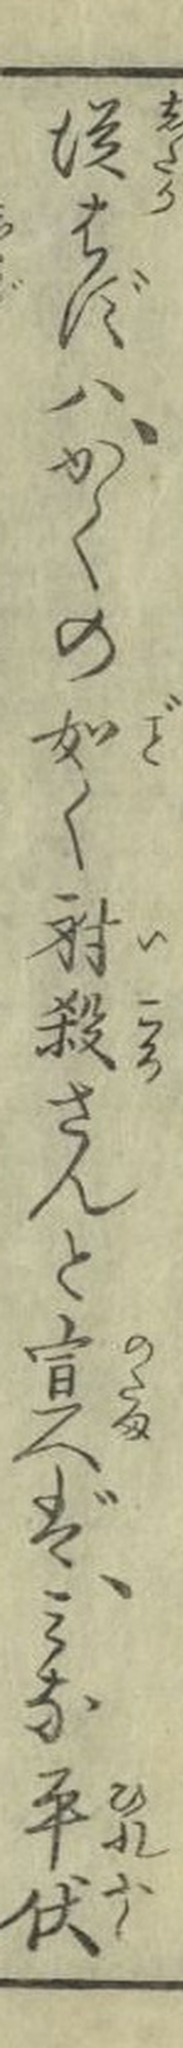従はずは、かくの如く射殺さんと宣へば、みな平伏
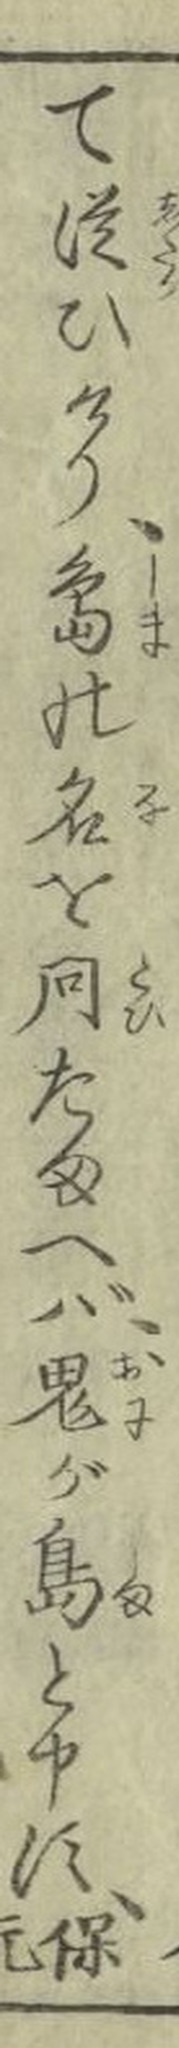て従ひけり、島の名を問たまへば、鬼が島と申す、保元
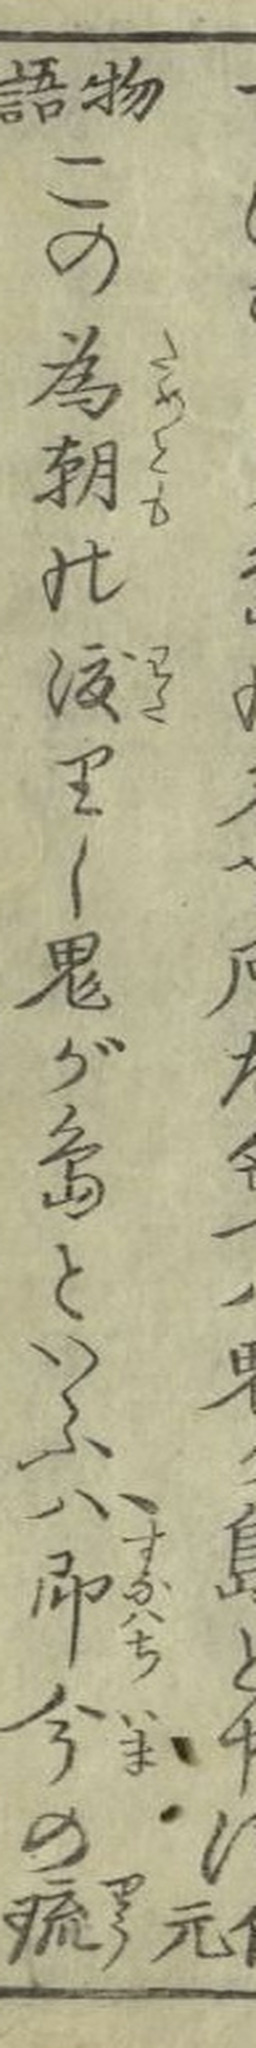物語この為朝の渡りし鬼が島といふは、即今の琉
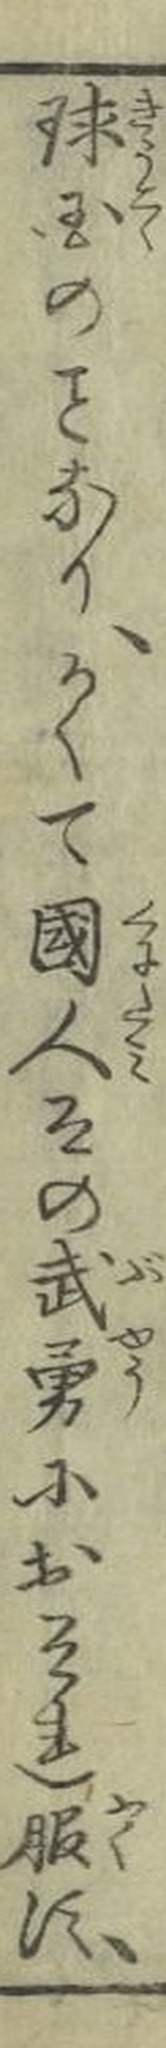球国のことなり、かくて国人その武勇におそれ服す、

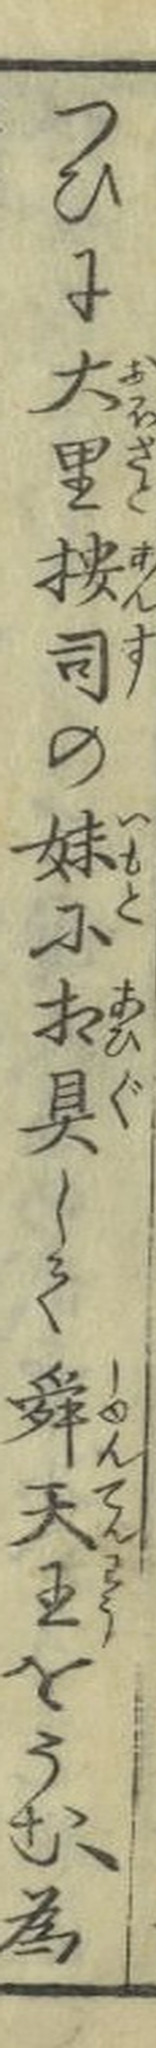つひに大里按司の妹に相具して舜天王をうむ、為
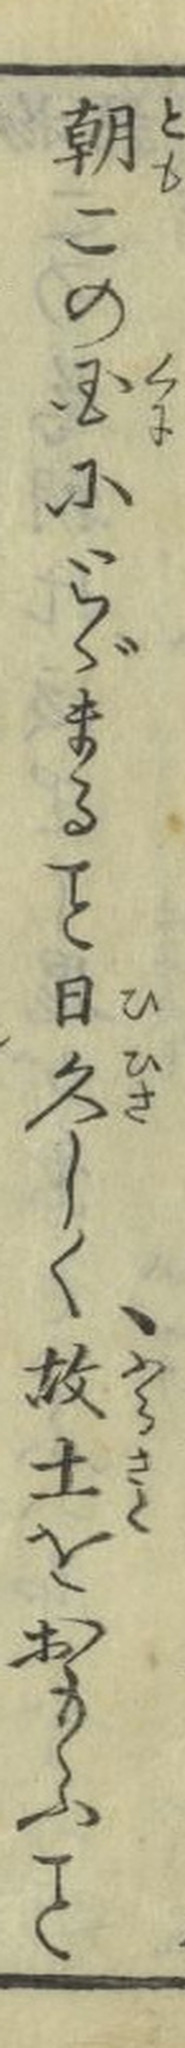朝この国にとゞまること日久しく、故土をおもふこと
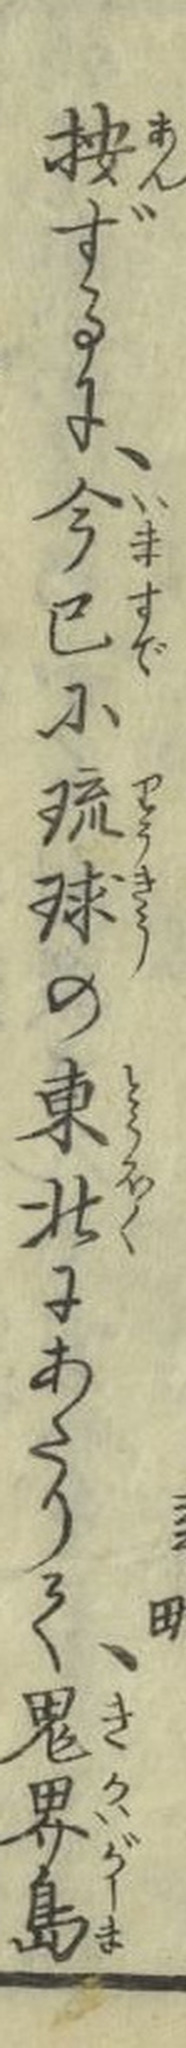按ずるに、今已に琉球の東北にあたりて、鬼界島
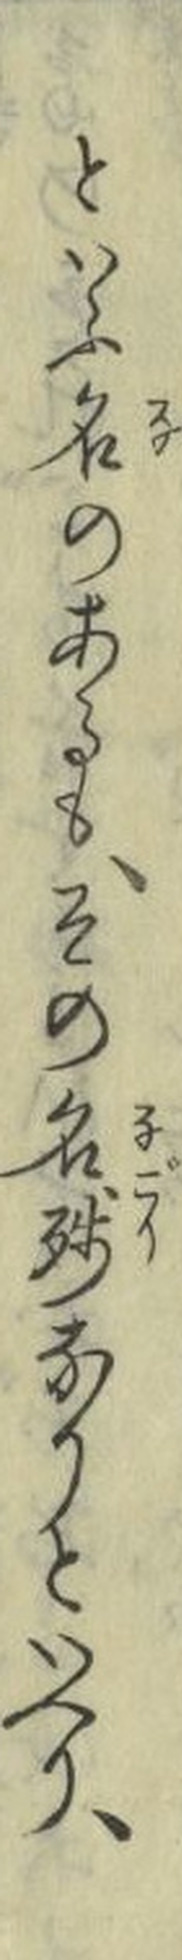といふ名のあるも、その名残なりといへり、
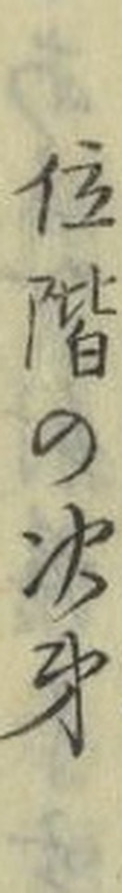位階の次第
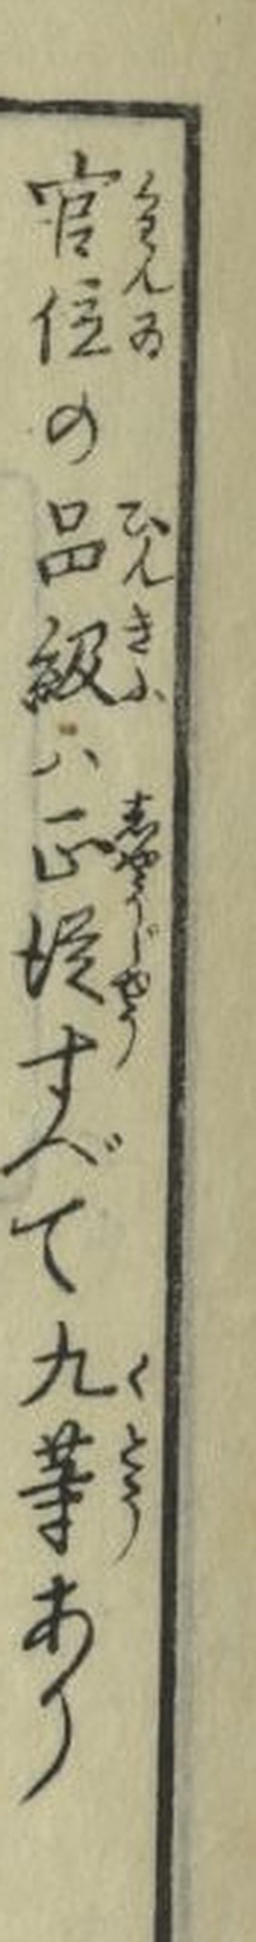官位の品級は正従すべて九等あり
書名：琉球入貢紀略
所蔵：University of the Ryukyus Library
